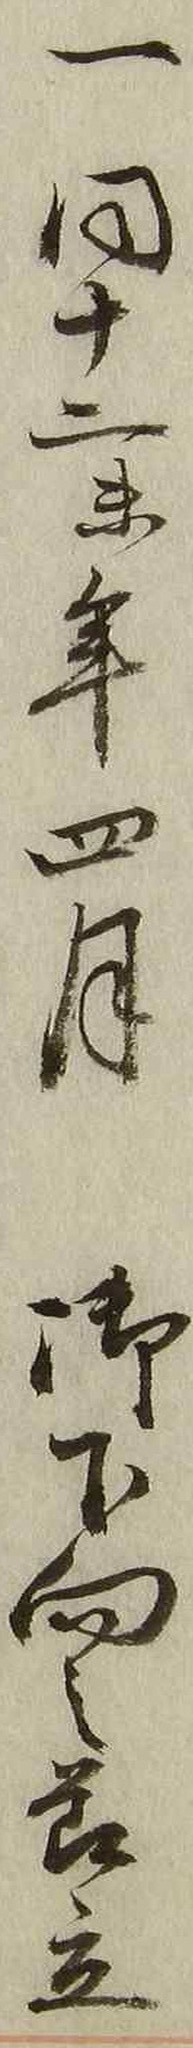一同十二未年四月御下向之節立
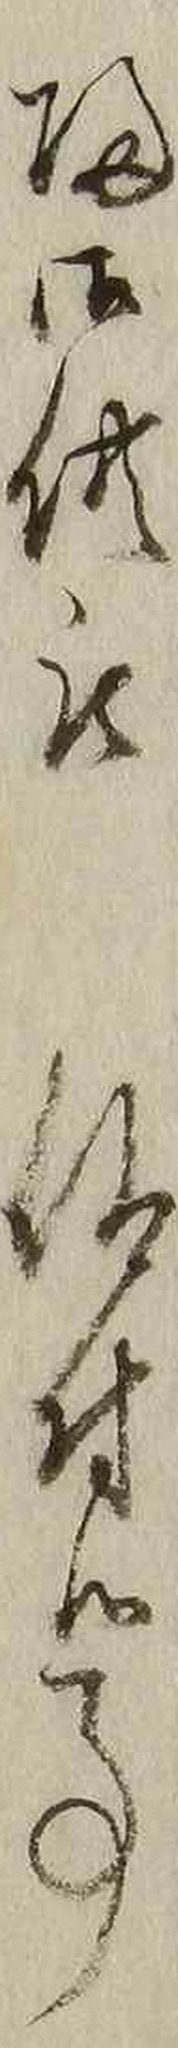帰御供被仰付候事
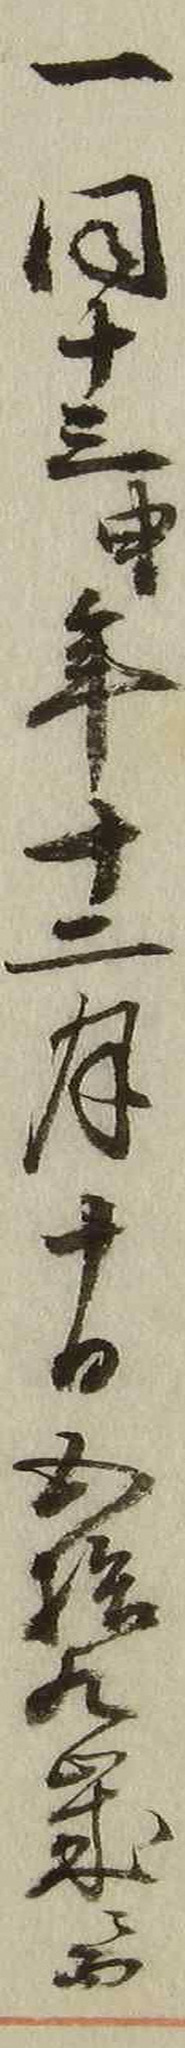一同十三申年十二月十日五拾九歳ニ而
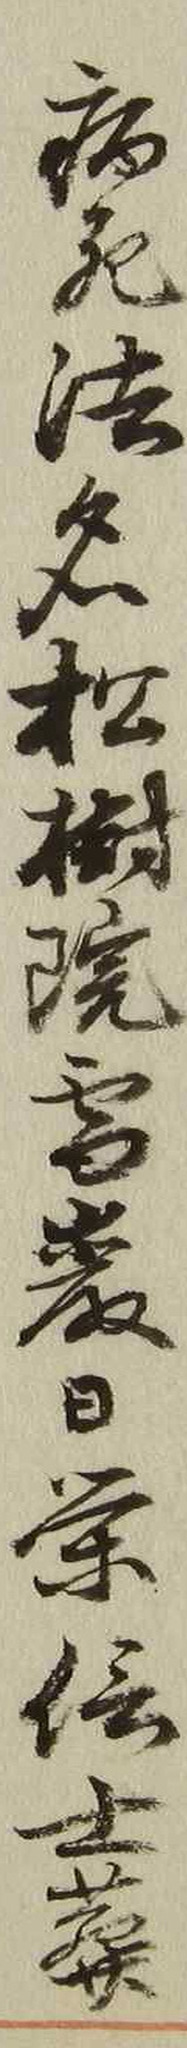病死法名松樹院雪巌日栄信士葬
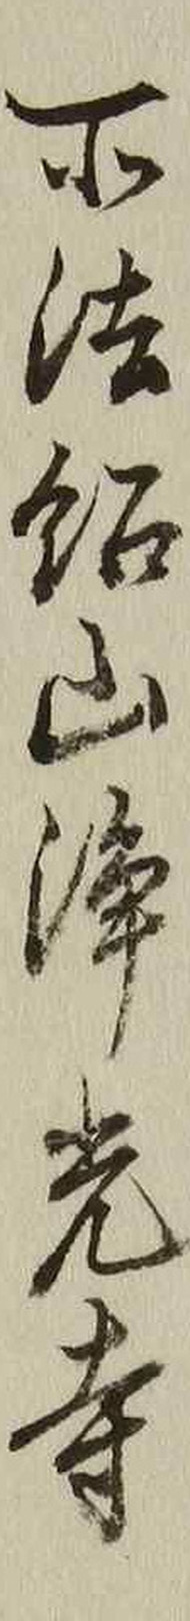所法紹山浄光寺
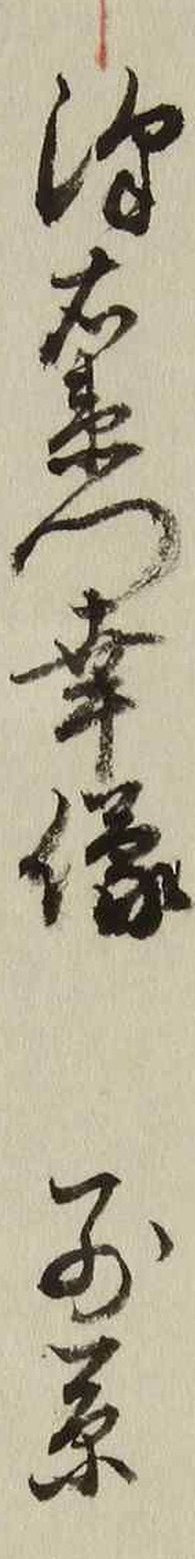沢右衛門幸像別系
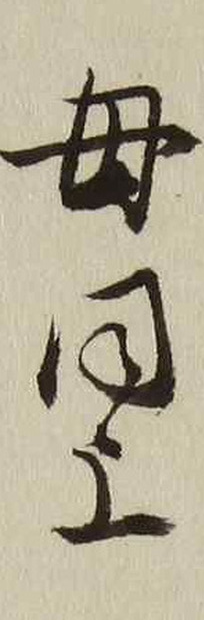母同上
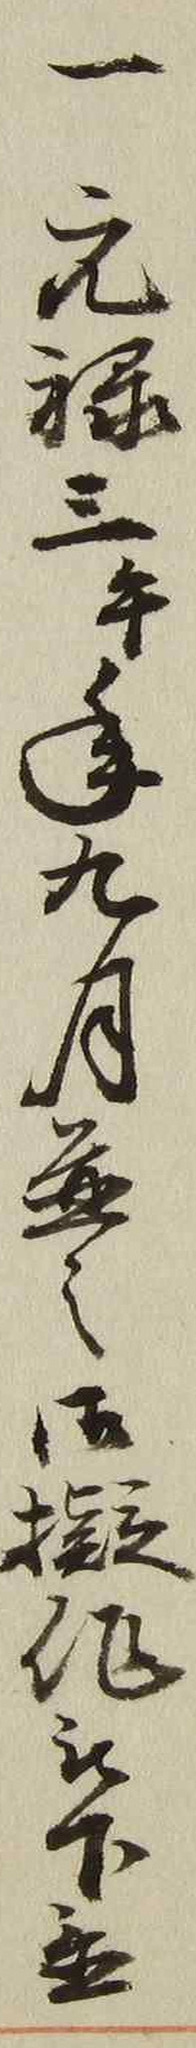一元禄三午年九月並之御擬作取下置
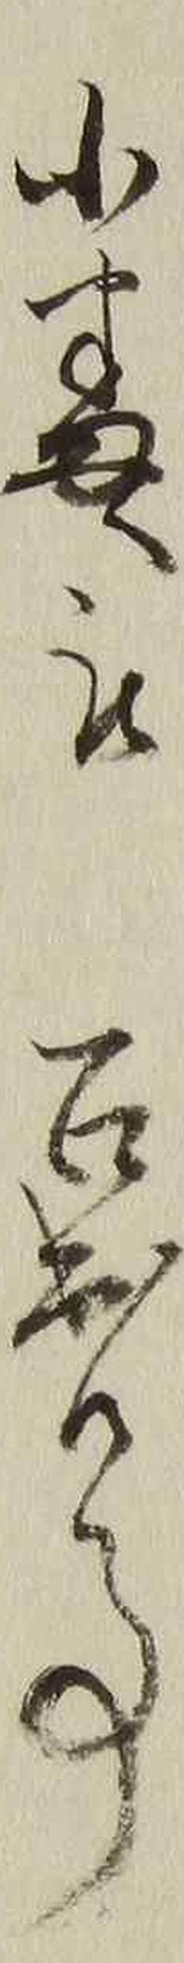小番へ被召出候事
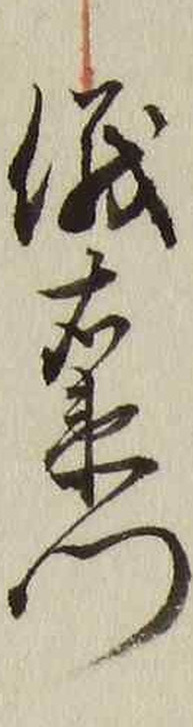儀右衛門
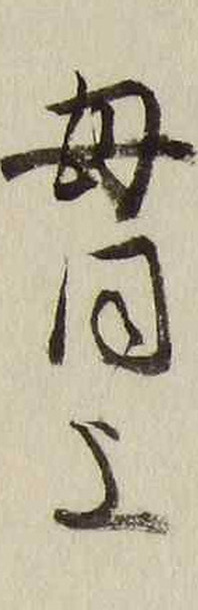母同上

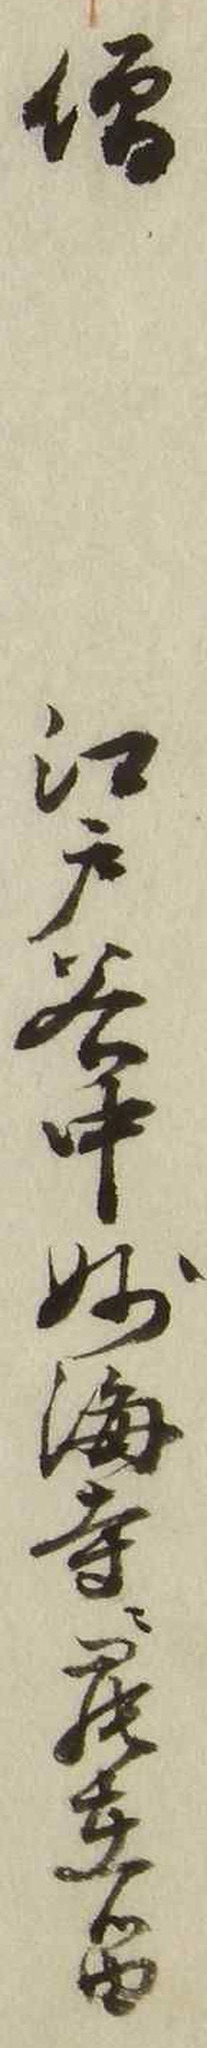僧江戸谷中妙海寺ニ罷在候由
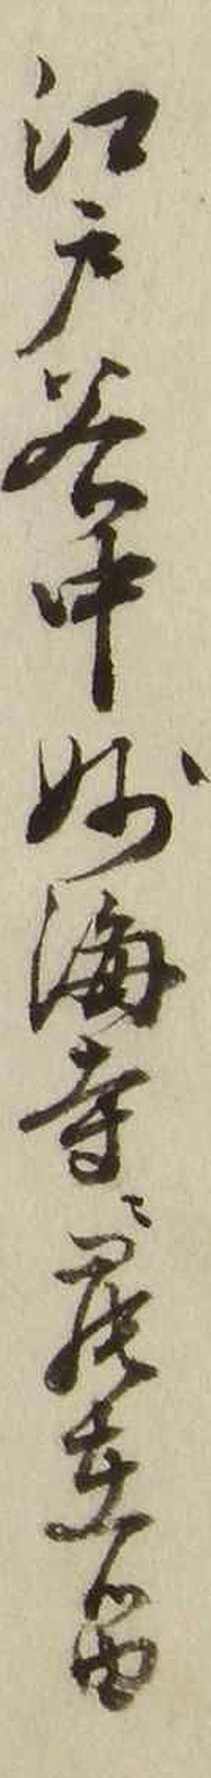僧江戸谷中妙海寺ニ罷在候由
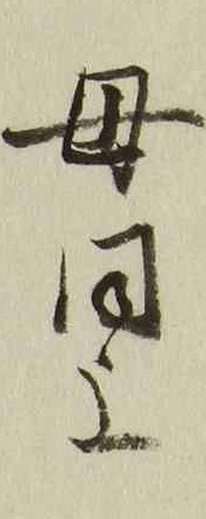母同上
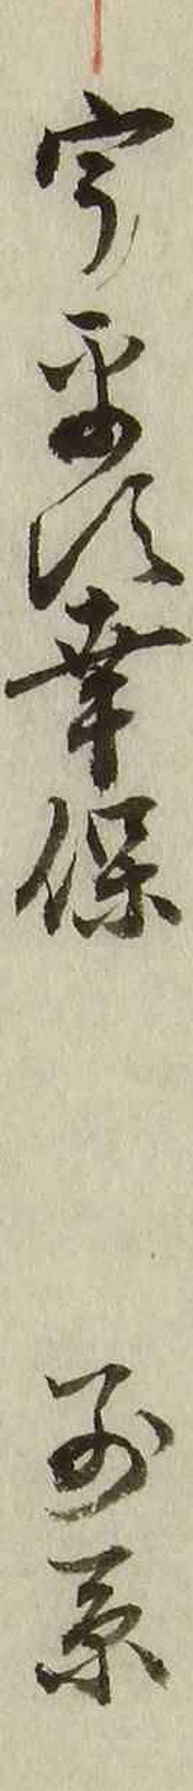宇平次幸保別系
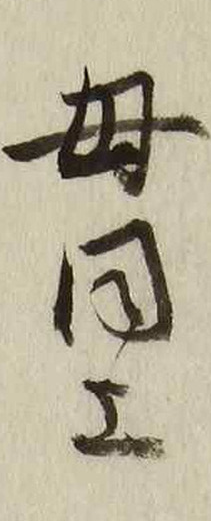母同上
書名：諸士系譜　巻之39　は之部7
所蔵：会津若松市立会津図書館
